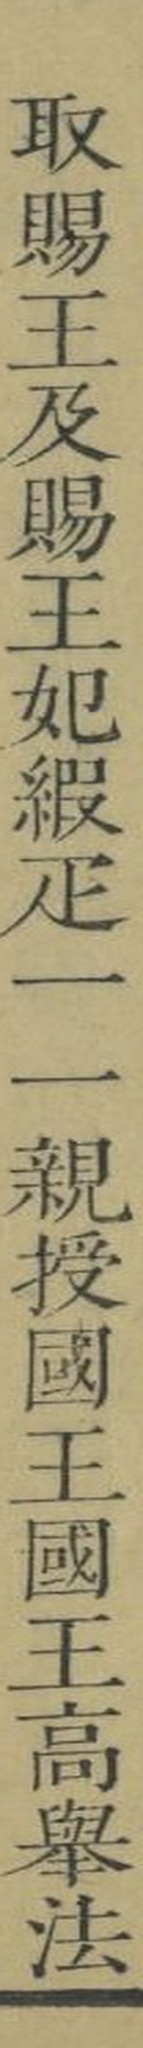取賜王及賜王妃縀疋一一親授國王國王高舉法
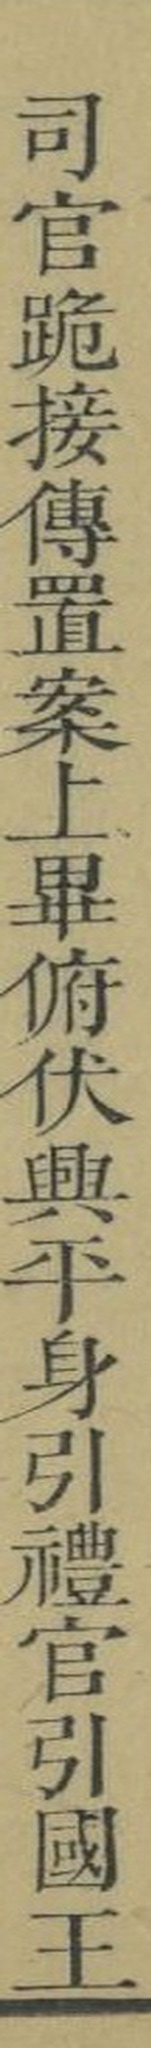司官跪接傳置案上畢俯伏興平身引禮官引國王
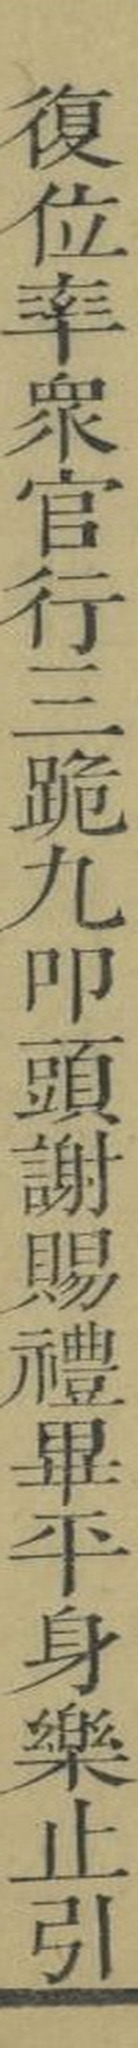復位率衆官行三跪九叩頭謝賜禮畢平身樂止引
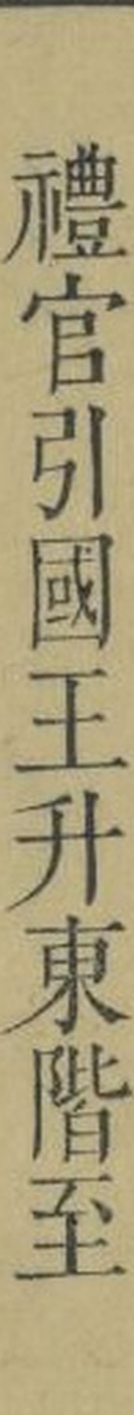禮官引國王升東階至
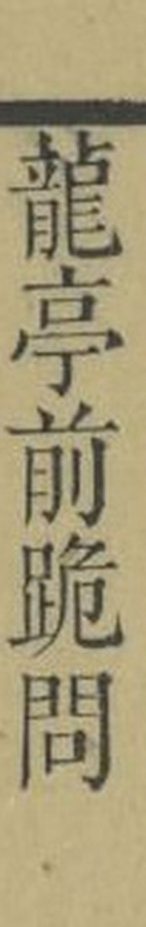龍亭前跪問
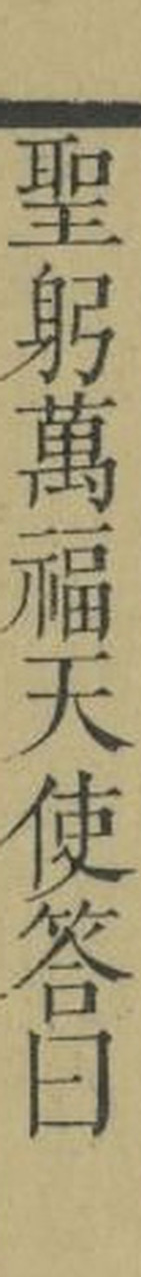聖躬萬福天使答曰
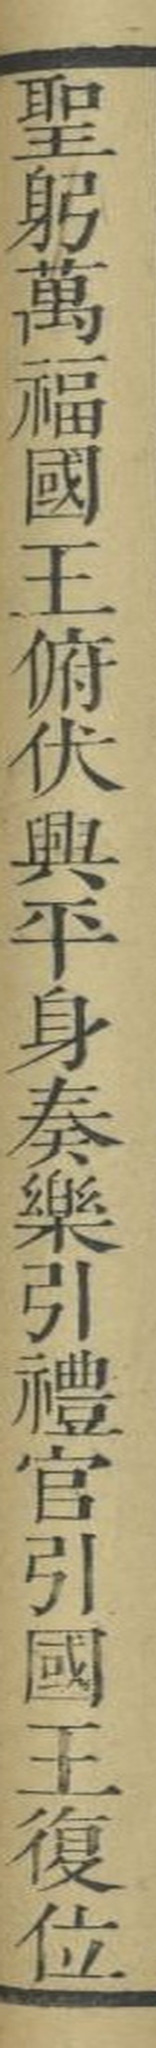聖躬萬福國王俯伏興平身奏樂引禮官引國王復位
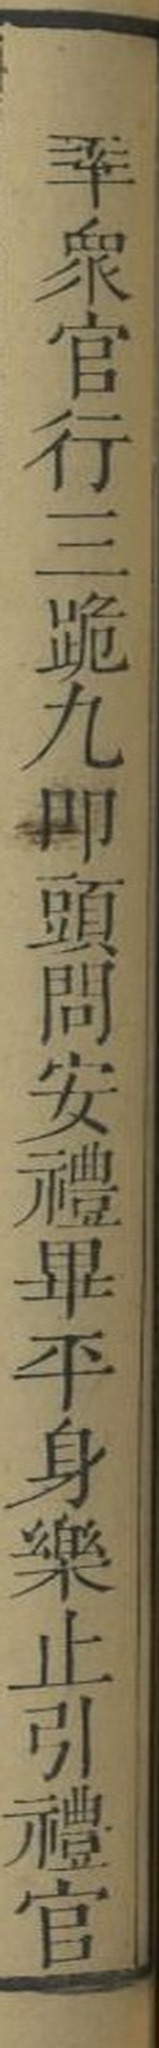率衆官行三跪九叩頭問安禮畢平身樂止引禮官
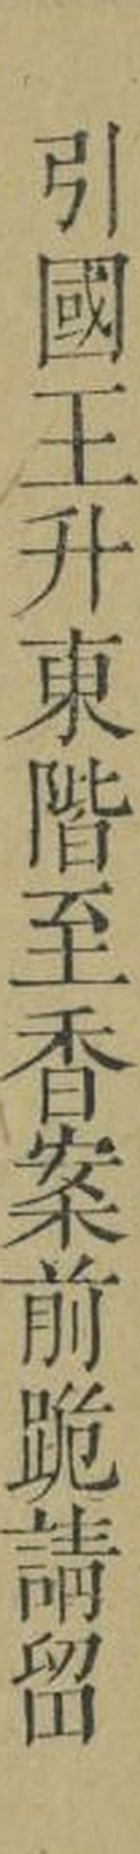引國王升東階至香案前跪請留
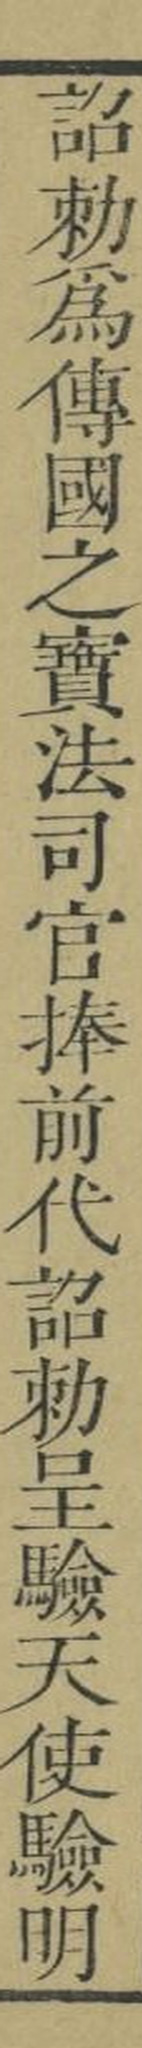詔勅爲傳國之寶法司官捧前代詔勅呈驗天使驗明
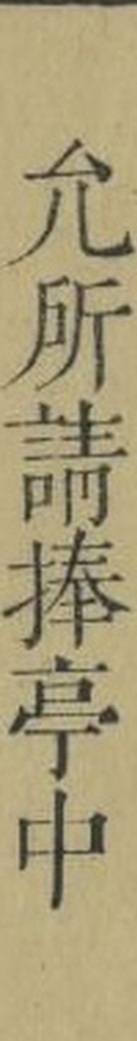允所請捧亭中
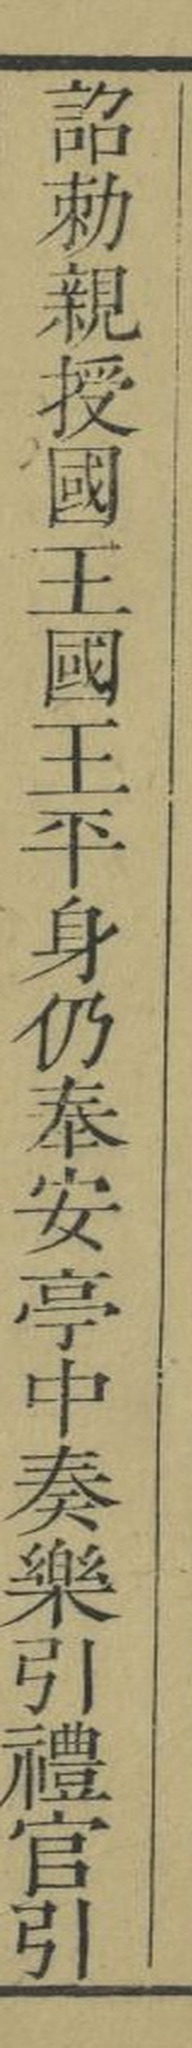詔勅親授國王國王平身仍奉安亭中奏樂引禮官引
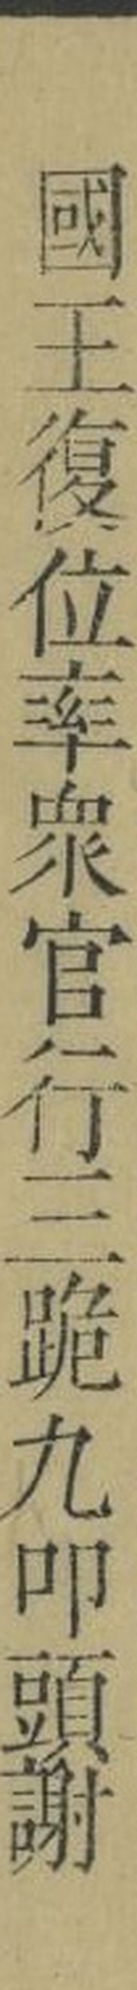國王復位率衆官行三跪九叩頭謝
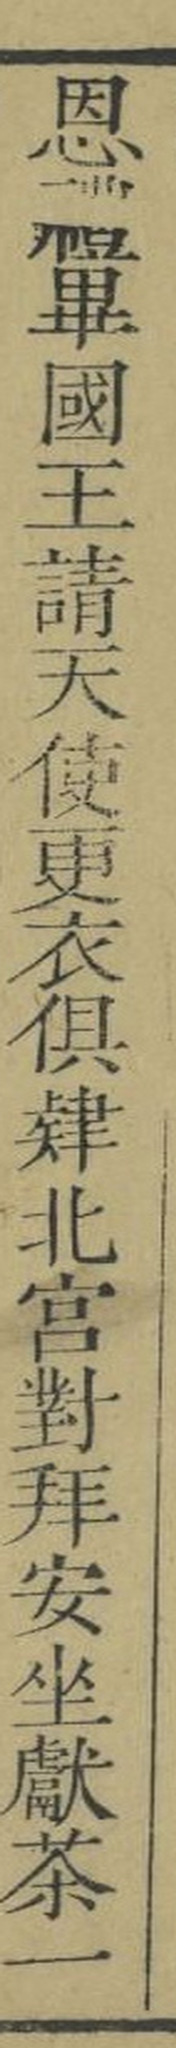恩禮畢國王請天使更衣倶肄北宫對拜安坐獻茶一
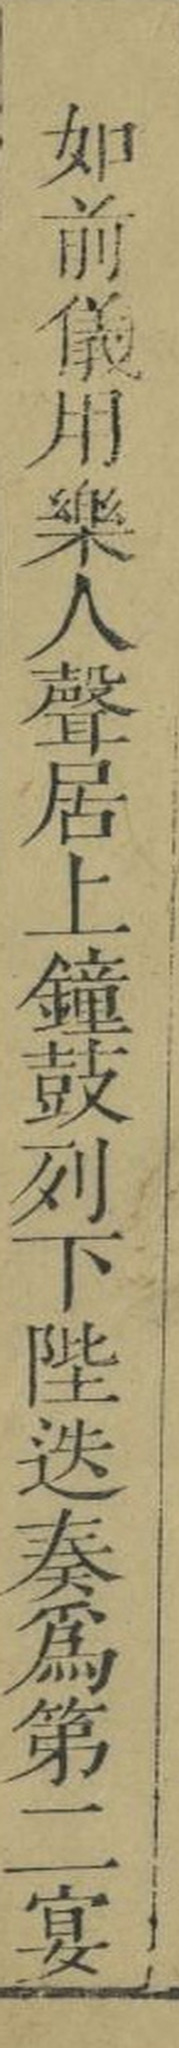如前儀用樂人聲居上鐘鼓列下陛迭奏爲第二宴
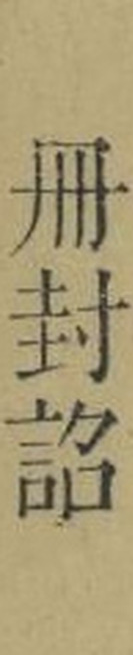冊封詔
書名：中山伝信録 巻二
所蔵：University of the Ryukyus Library
